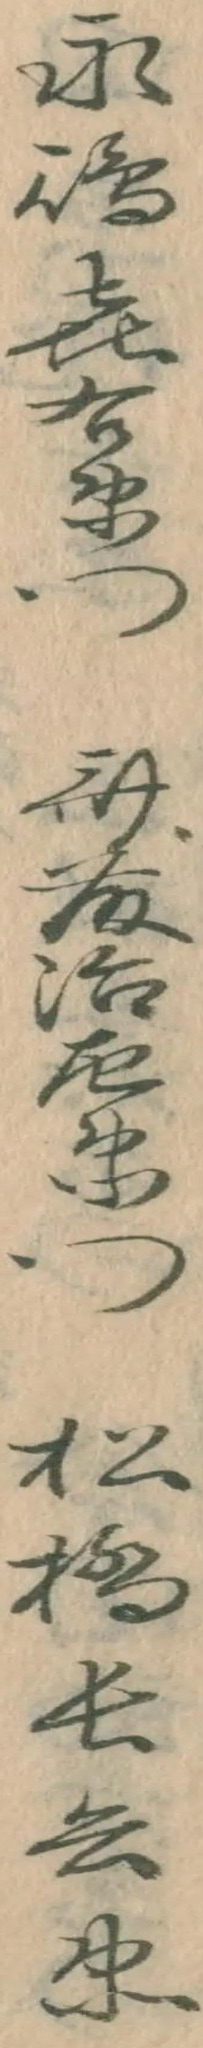永島喜右衛門斎藤治左衛門松橋長兵衛

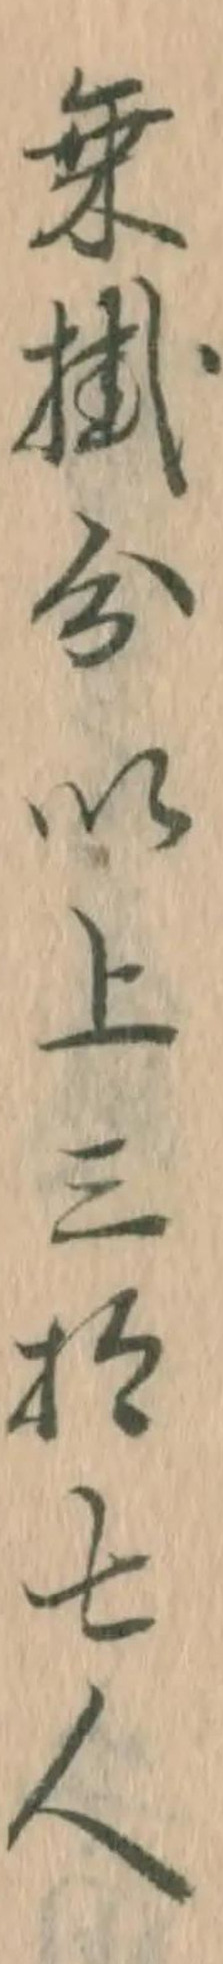乗掛分以上三拾七人
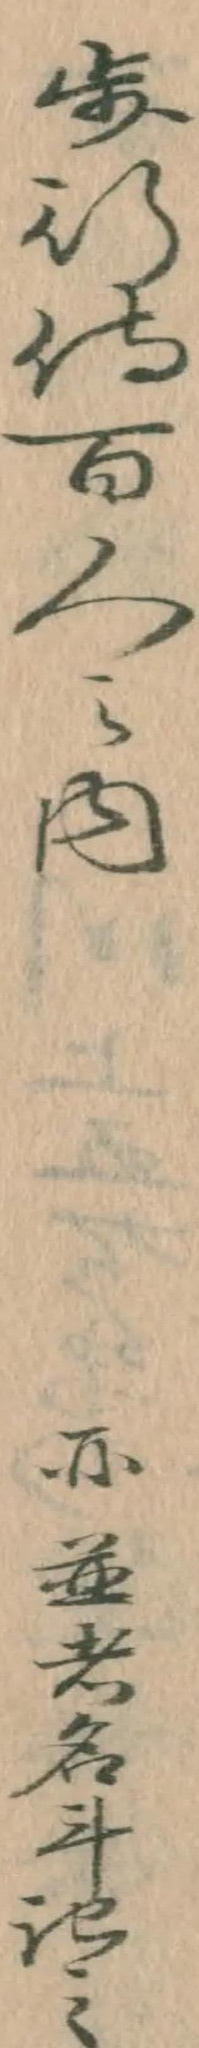歩行侍百人之内亦並者名計記之
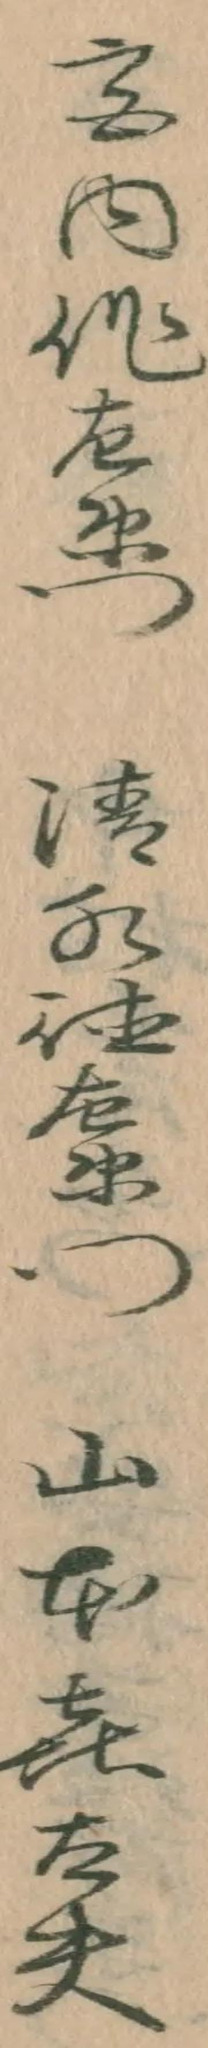宮内作左衛門清水徳左衛門山本喜太夫
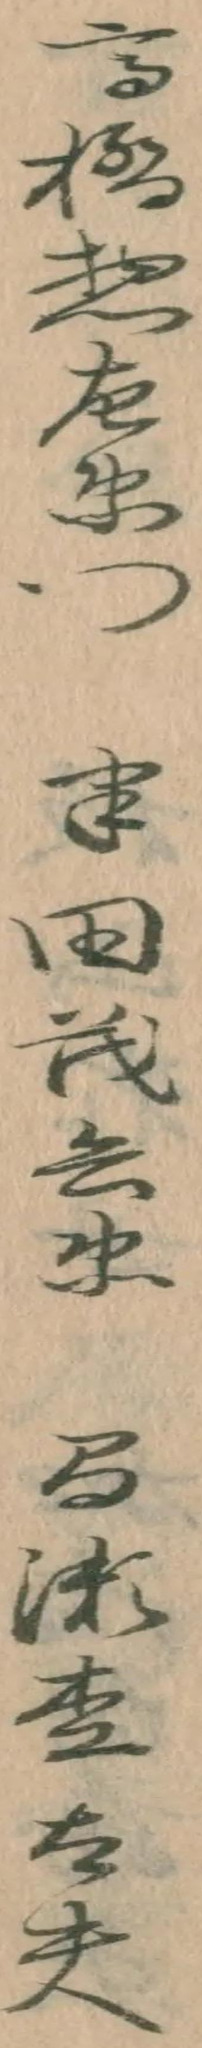高橋惣左衛門半田茂兵衛間瀬杢太夫
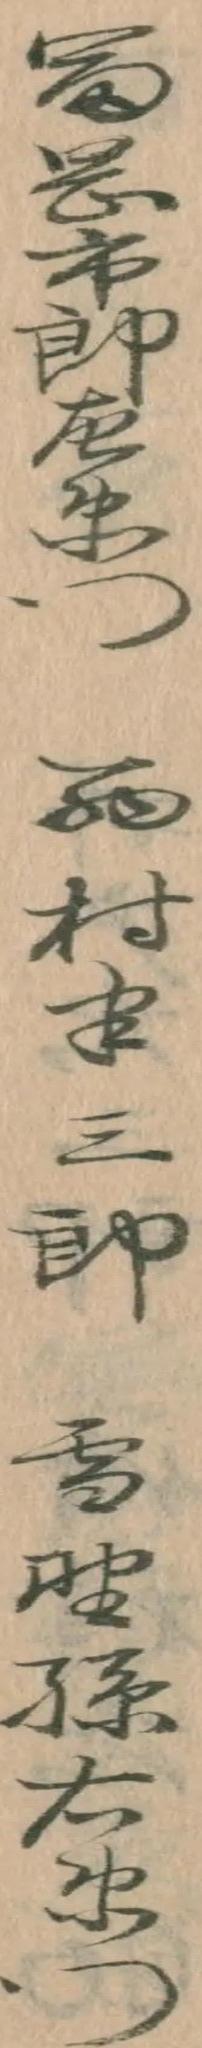富岡市郎左衛門西村半三郎雪野孫右衛門
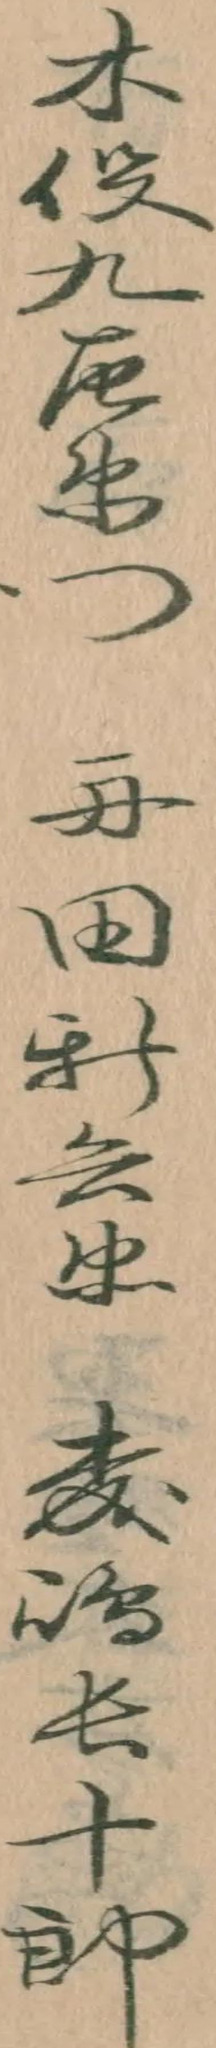木俣九左衛門舟田新兵衛森島長十郎
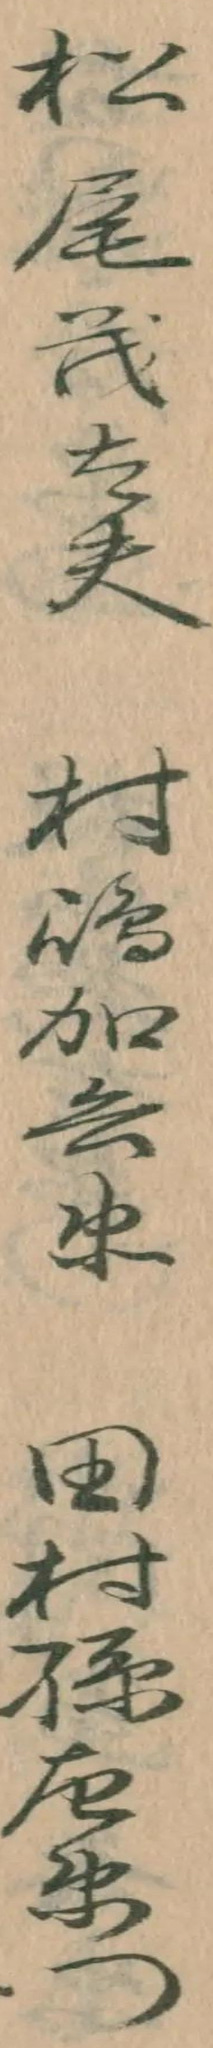松尾茂太夫村島加兵衛田村孫左衛門
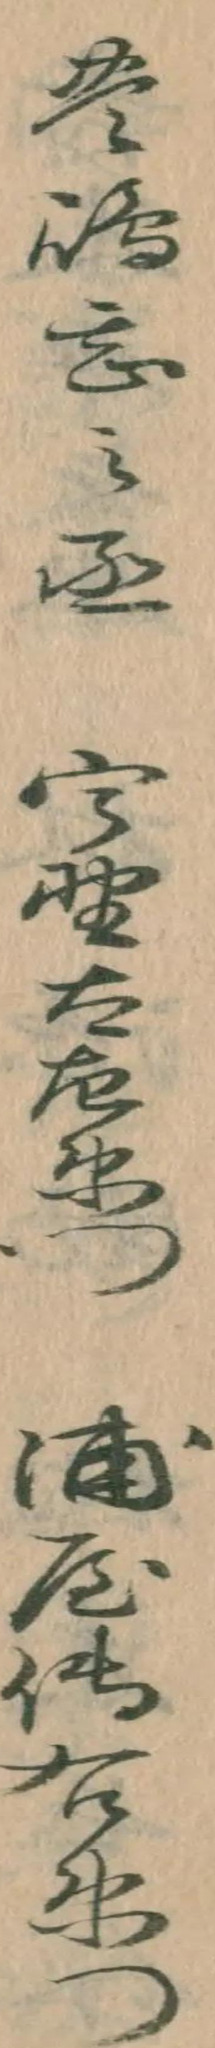豊島甚之丞宇野太左衛門浦屋伝右衛門
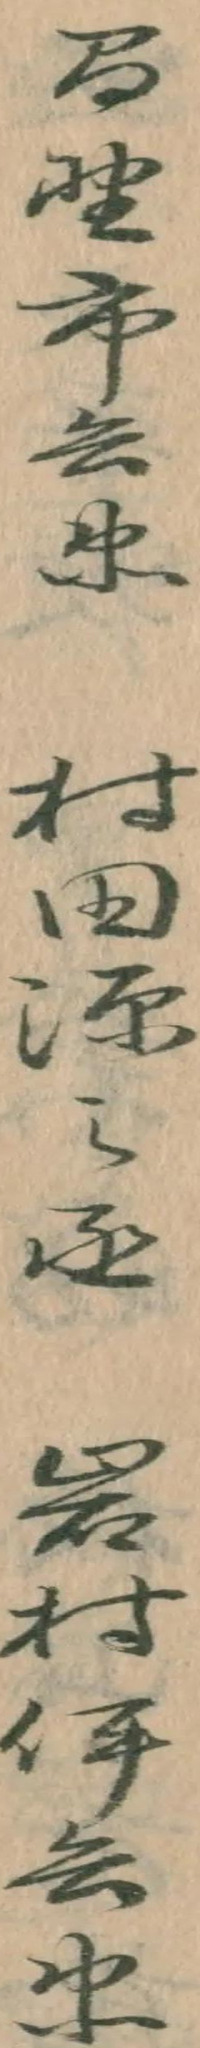間野市兵衛村田源之丞岩村伊平衛
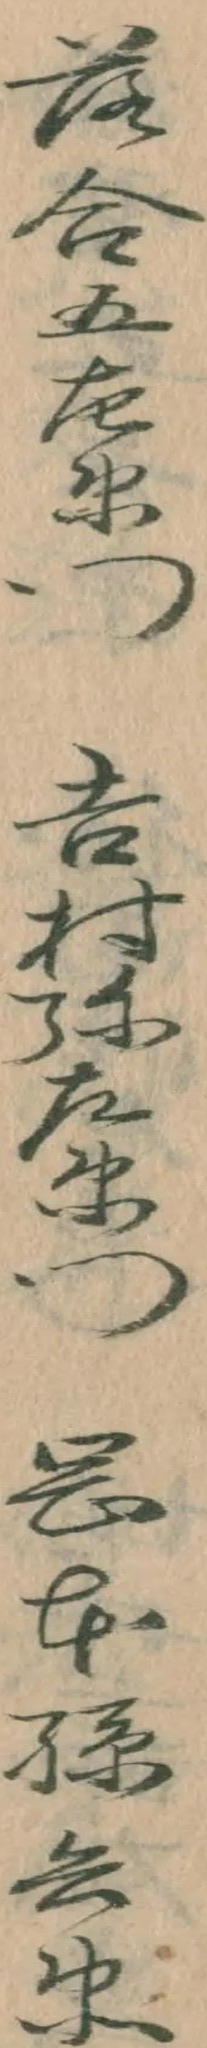落合五左衛門吉村弥左衛門岡本孫兵衛
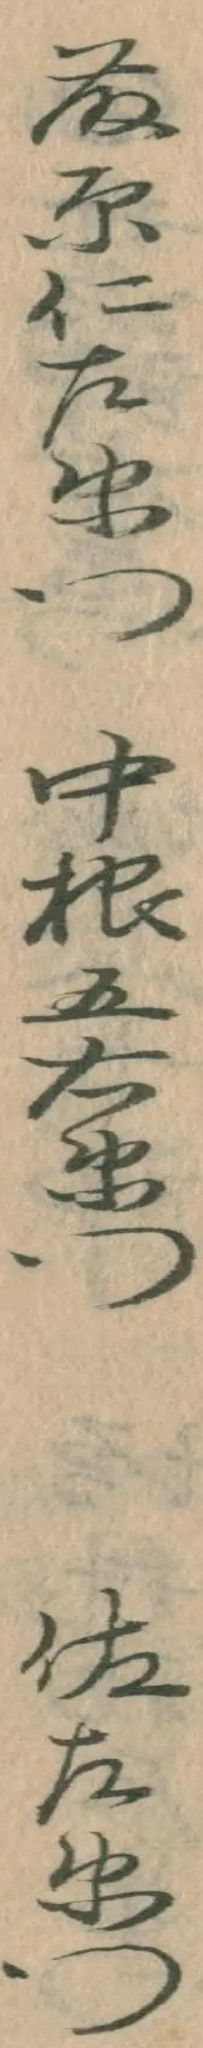藤原仁左衛門中根五右衛門佐左衛門
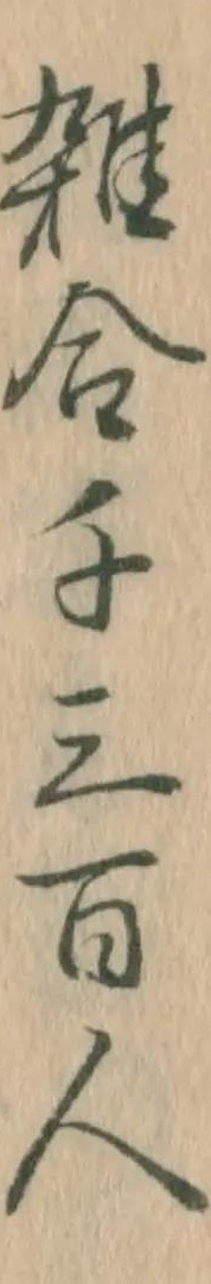雑合千三百人
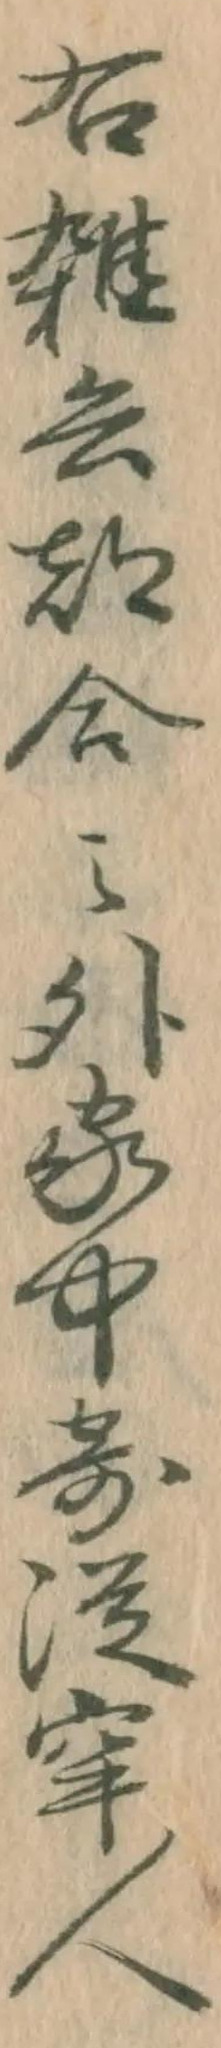右雑兵都合之外家中寄従牢人

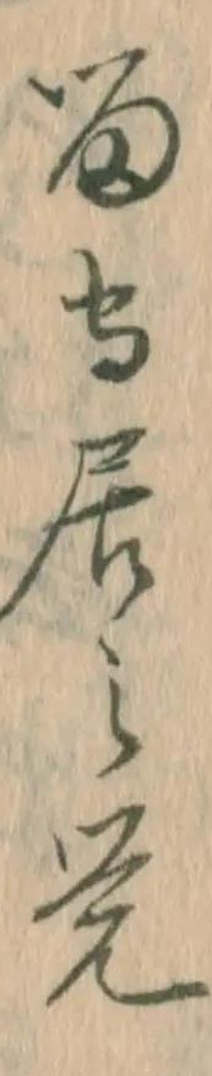留守居之覚
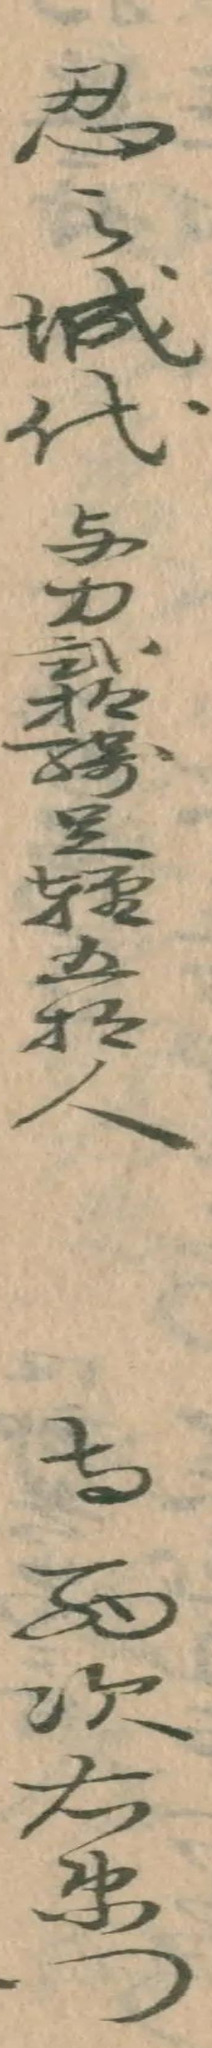忍之城代与力弐拾騎足軽五拾人寺西次右衛門
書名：切支丹御退治記 49巻. [3]
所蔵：国立国会図書館 National Diet Library, JAPAN
